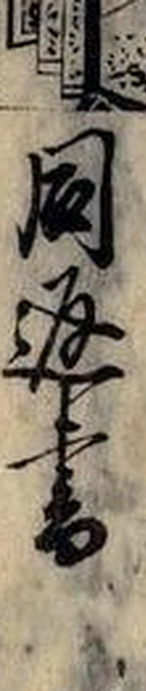同返書
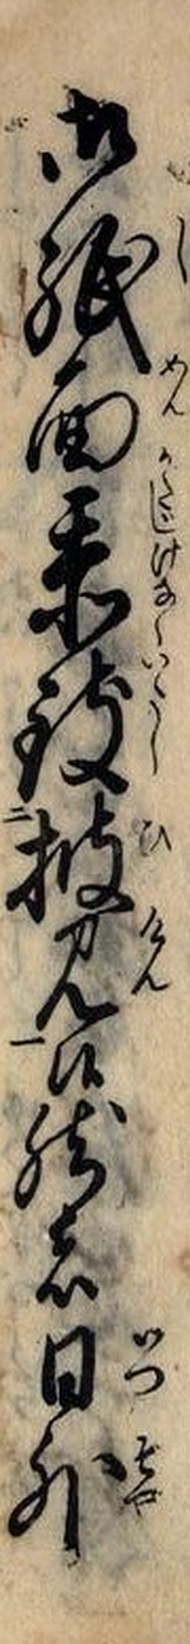御紙面忝致披見候然者日外
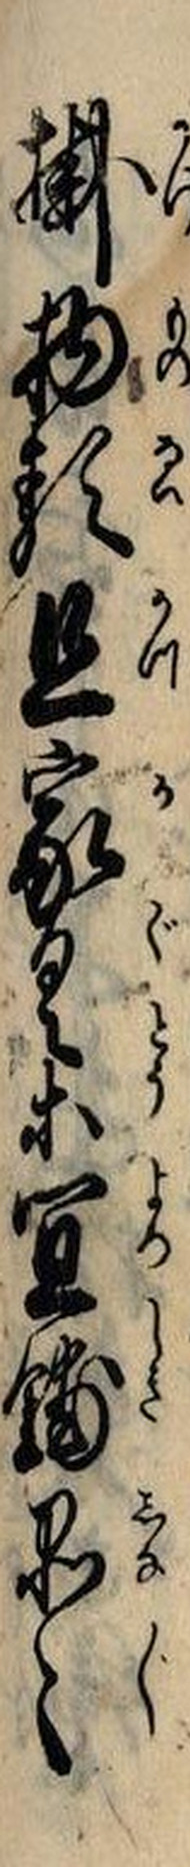掛物類且家具等宜敷品々
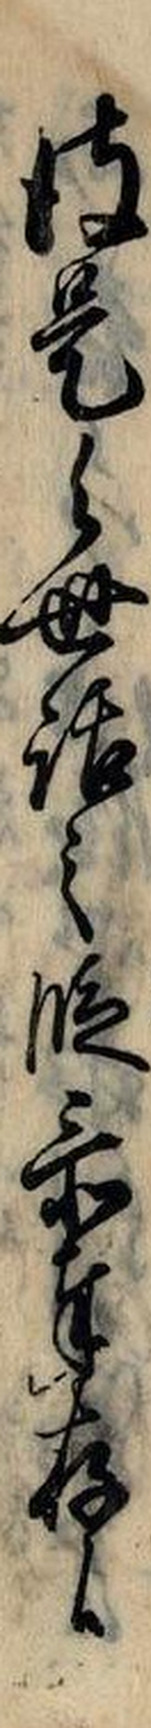彼是之世話之段忝奉存候
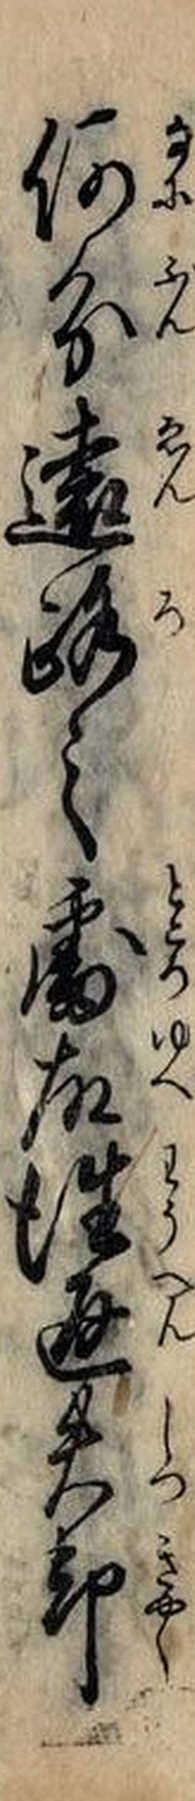何分遠路之處故往返失却
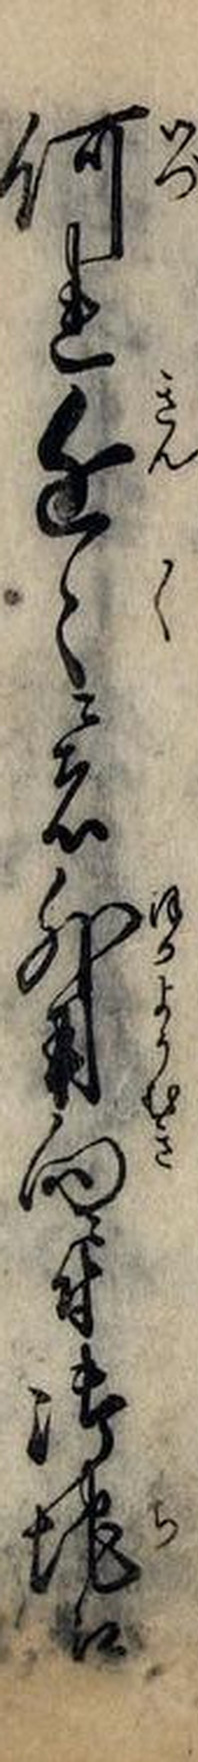何れ近々に者外用向に付御地江
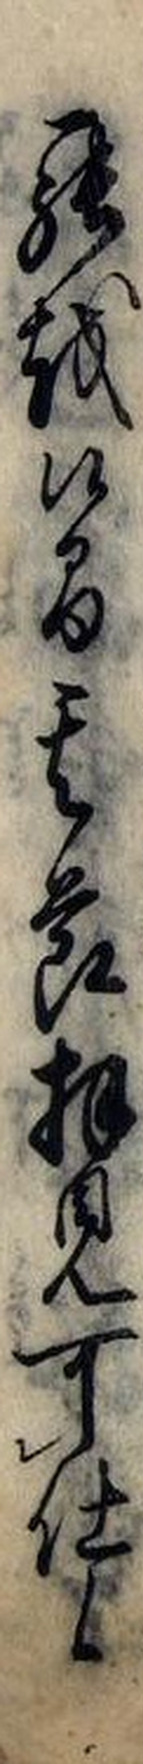罷越候間其節拝見可仕候

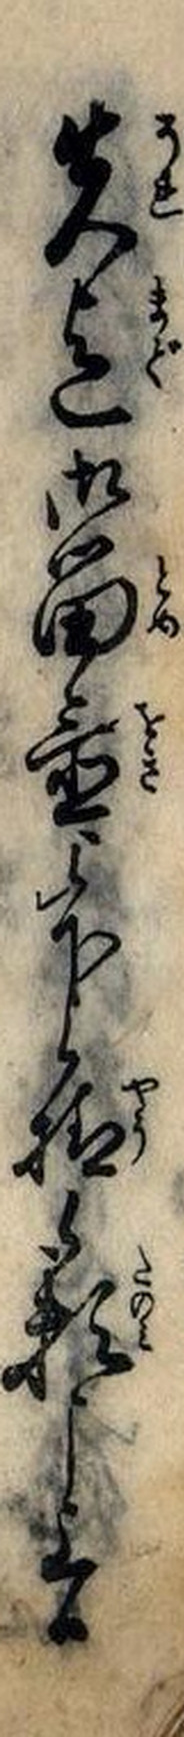先迄御留置被下候様御頼申上候
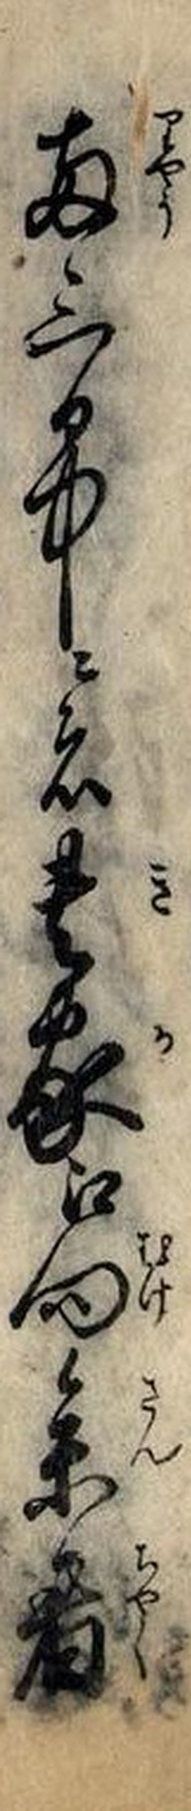両三日中に者貴家江向参着
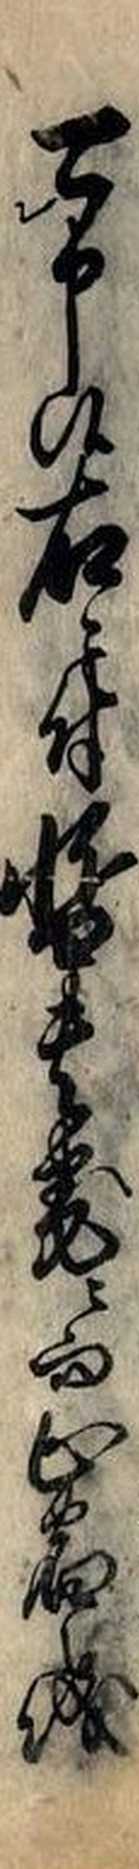可申候右に付暫貴宅に而止宿之儀
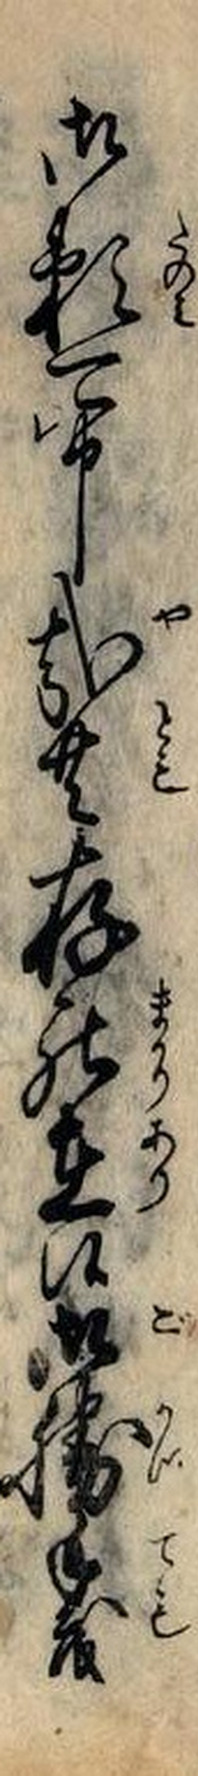御頼可申哉共存罷在候御勝手も
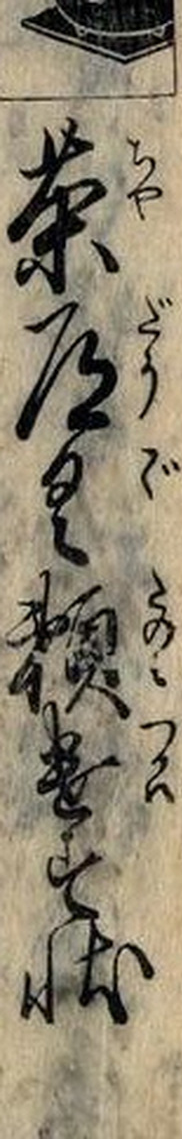茶道具頼遣す状
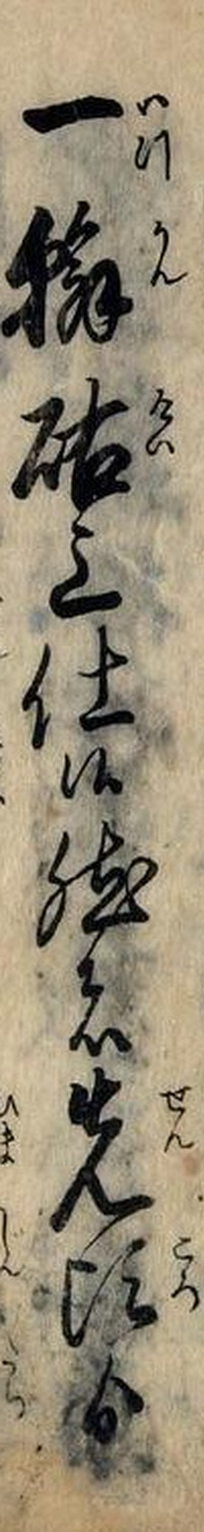一翰啓上仕候然者先頃ゟ
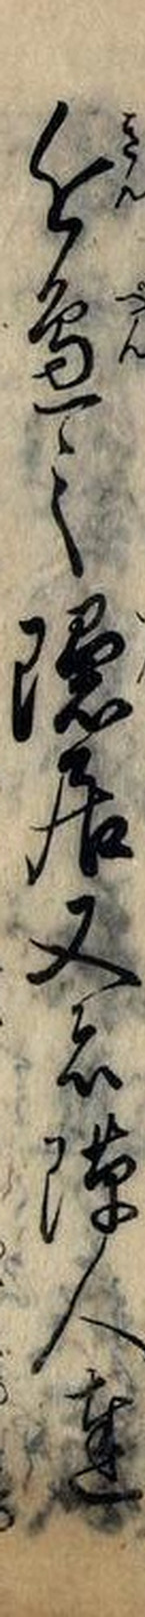近邊之隠居又者隙人達
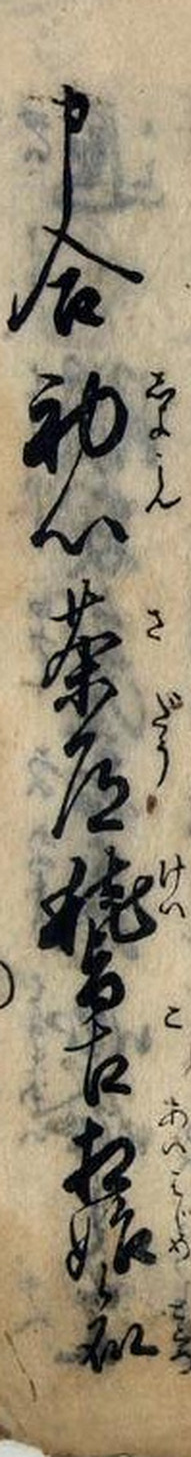申合初心茶道稽古相始候処

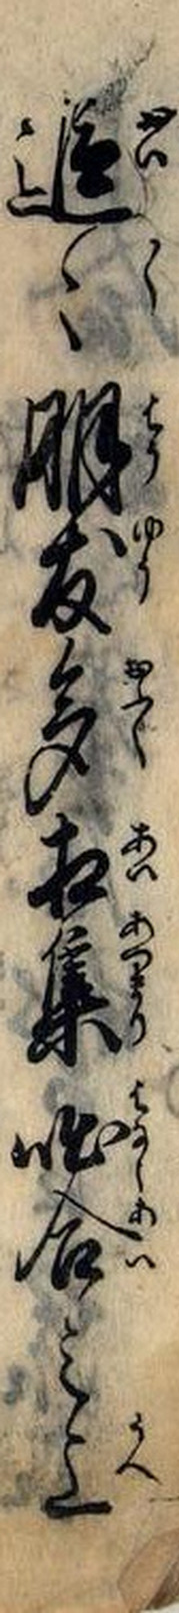追々朋友多相集咄合之上
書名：大成用文章（往来物）
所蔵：福井県文書館 Fukui Prefectural Archives
